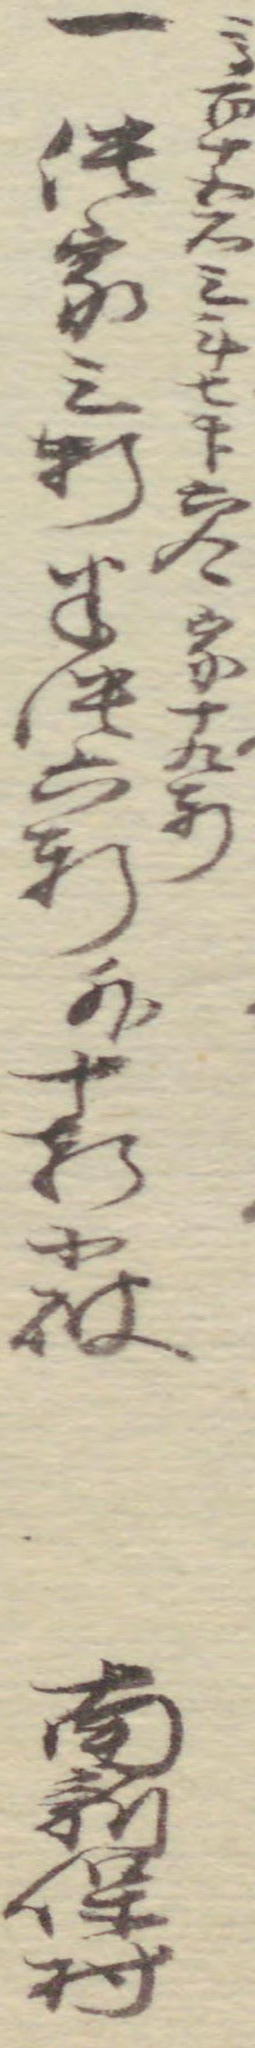一潰家三軒半潰六軒外十軒小破南新保村
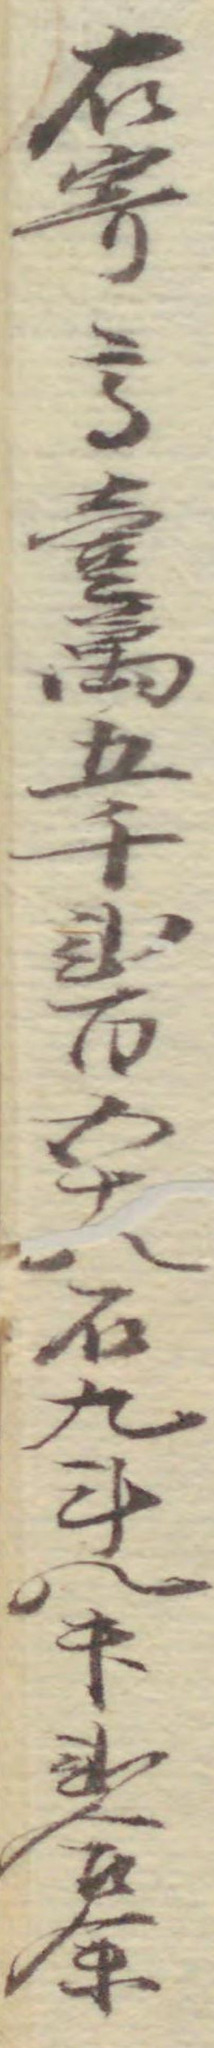右寄高壱万五千弐百五十八石九斗八升弐合余
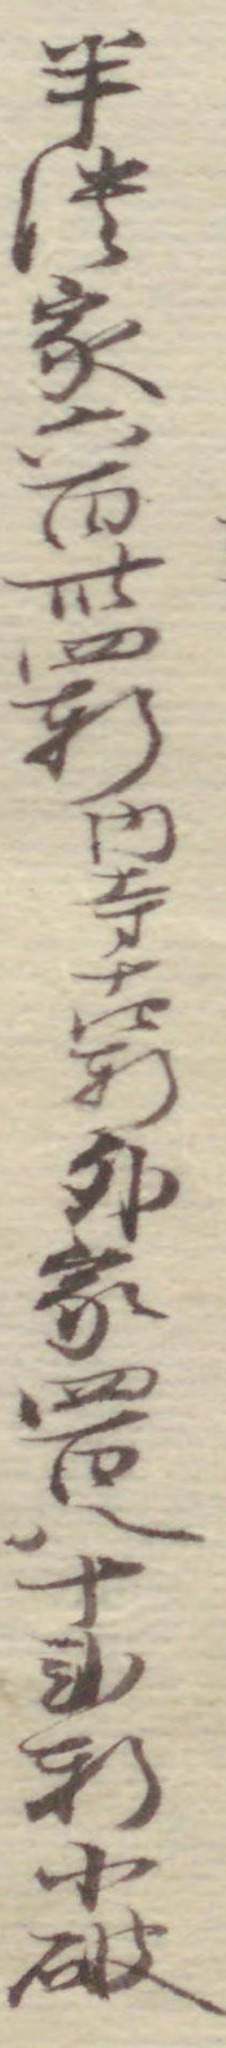半潰家六百卅四軒内寺十四軒外家四百八十弐軒小破
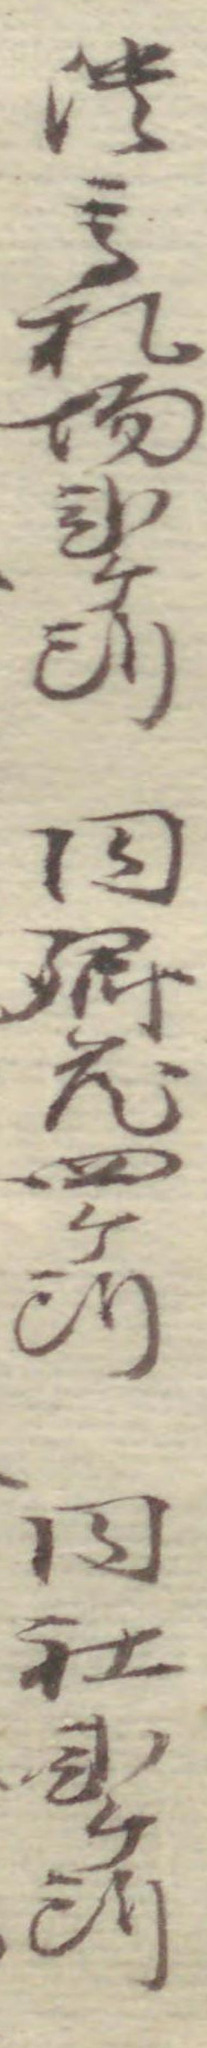潰高札場弐ケ所同郷蔵四ケ所同社弐ケ所
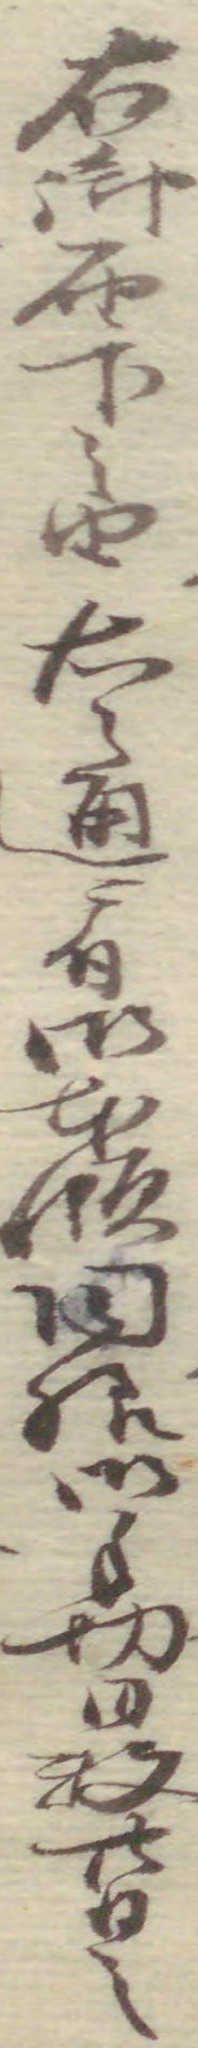右御届下之由右之通ニ付御本領同様御手切日数廿日之
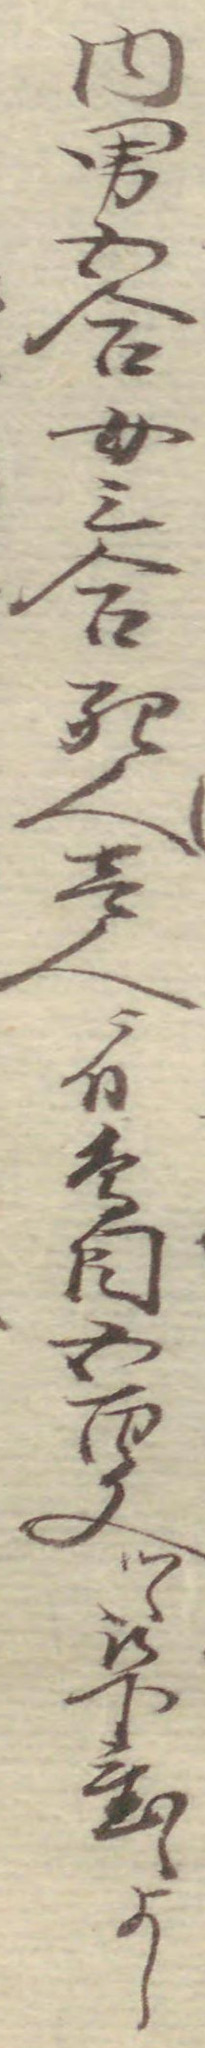内男五合女三合即死壱人ニ付鳥目五百文ツヽ被下置候よし
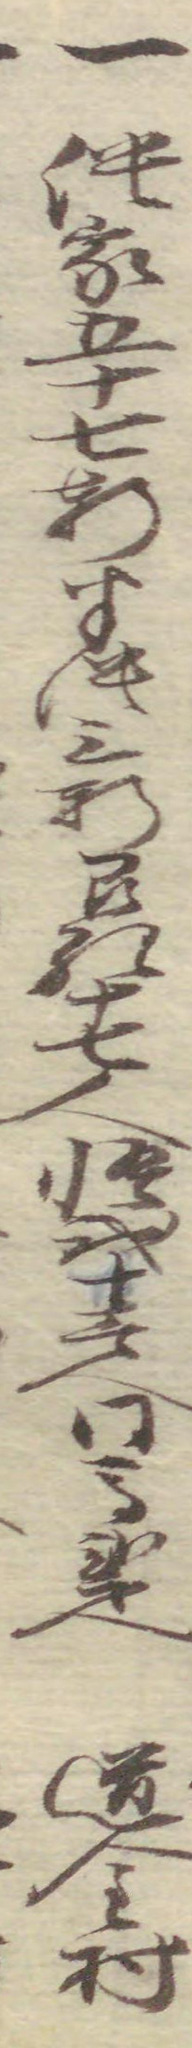一潰家五十七軒半潰三軒即死十七人怪我十壱人同馬弐疋道金村
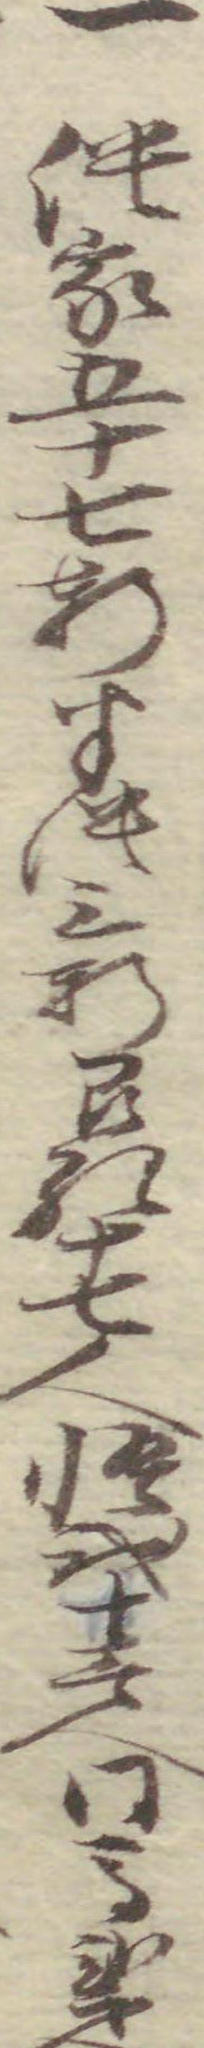一潰家五十七軒半潰三軒即死十七人怪我十壱人同馬弐疋道金村
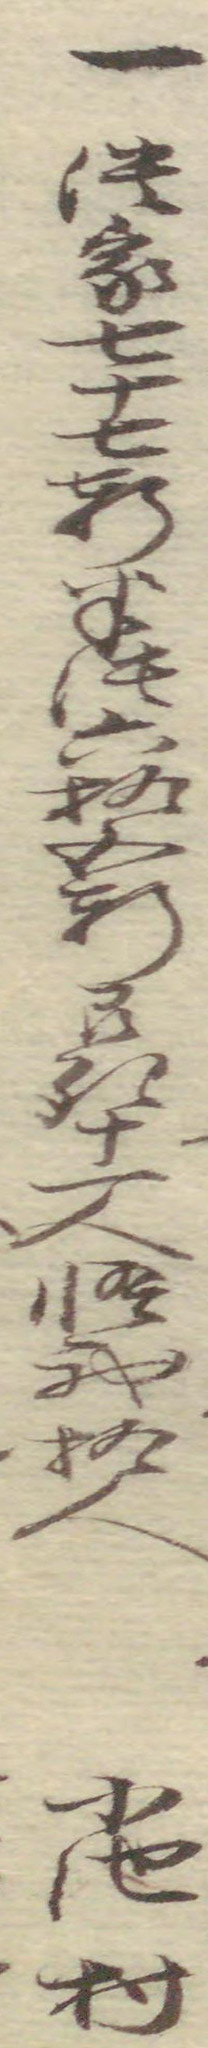一潰家七十七軒半潰六拾五軒即死十一人怪我拾人小池村
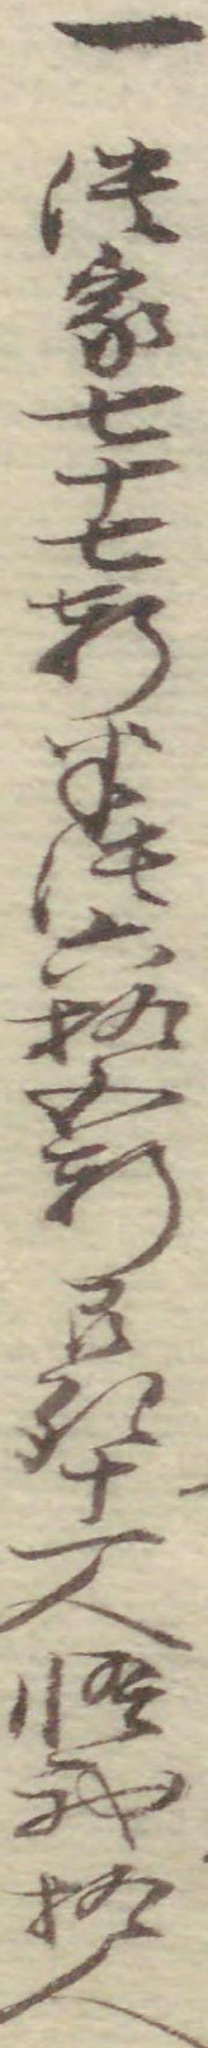一潰家七十七軒半潰六拾五軒即死十一人怪我拾人小池村
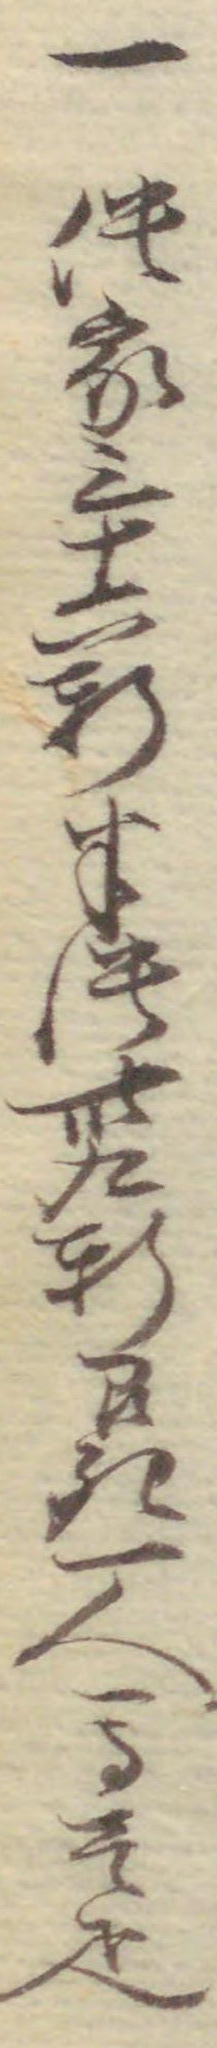一潰家三十六軒半潰卅九軒即死一人馬壱疋横田村

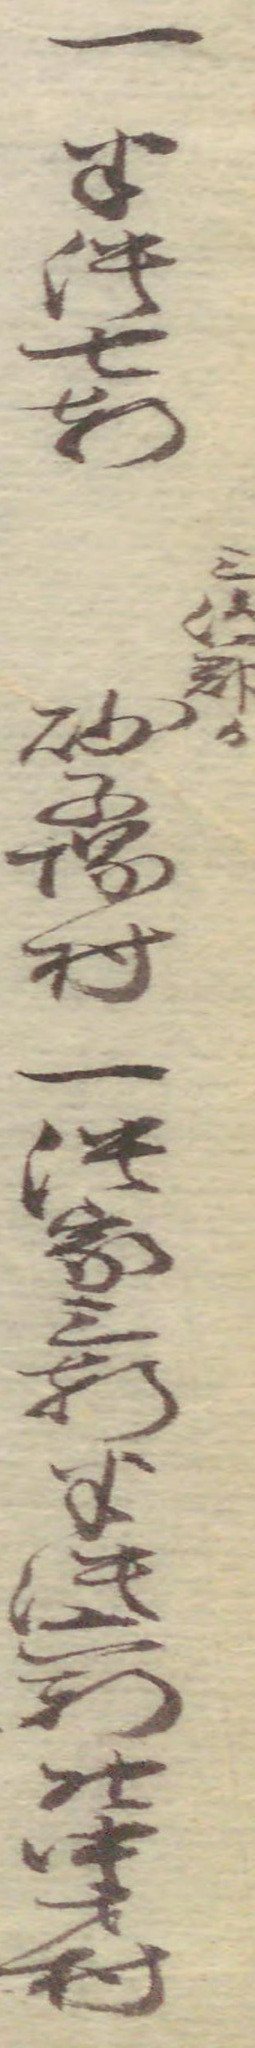一半潰七軒砂子塚村一潰家三軒半潰六軒野中才村
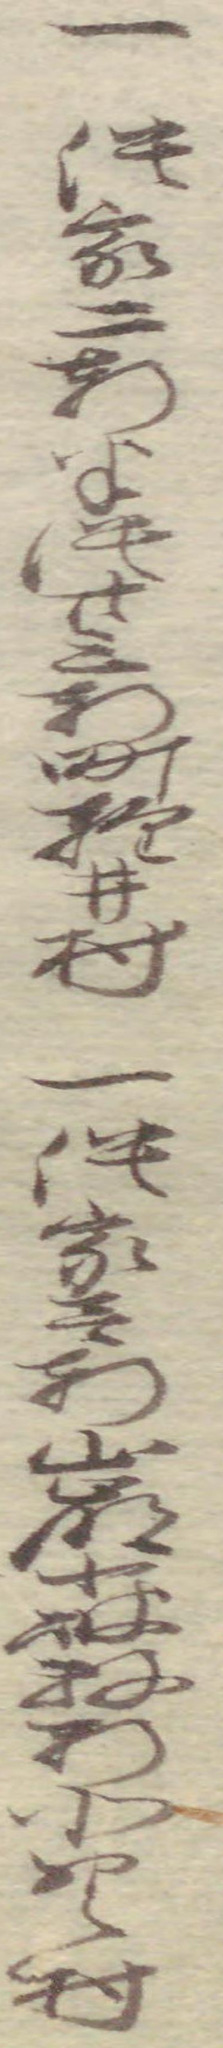一潰家二軒半潰廿三軒町軽井村一潰家壱軒山崩小破数軒北野村
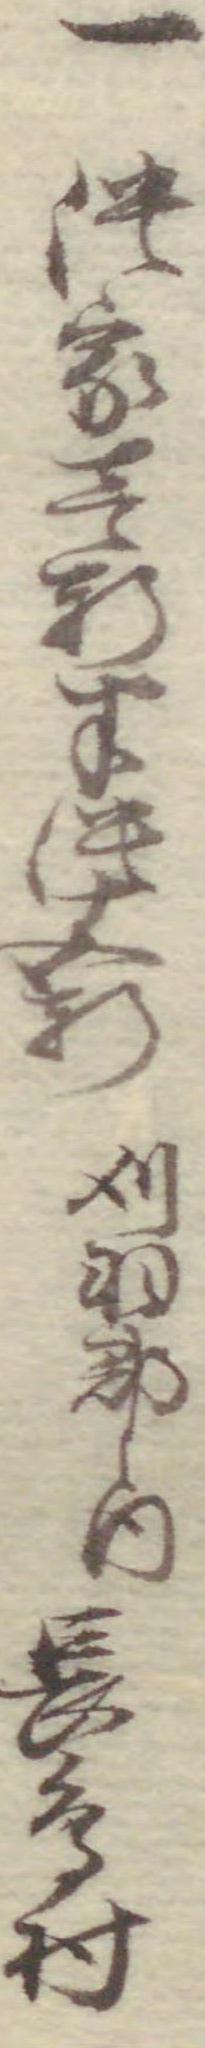一潰家壱軒半潰十五軒刈羽郡之内長鳥村
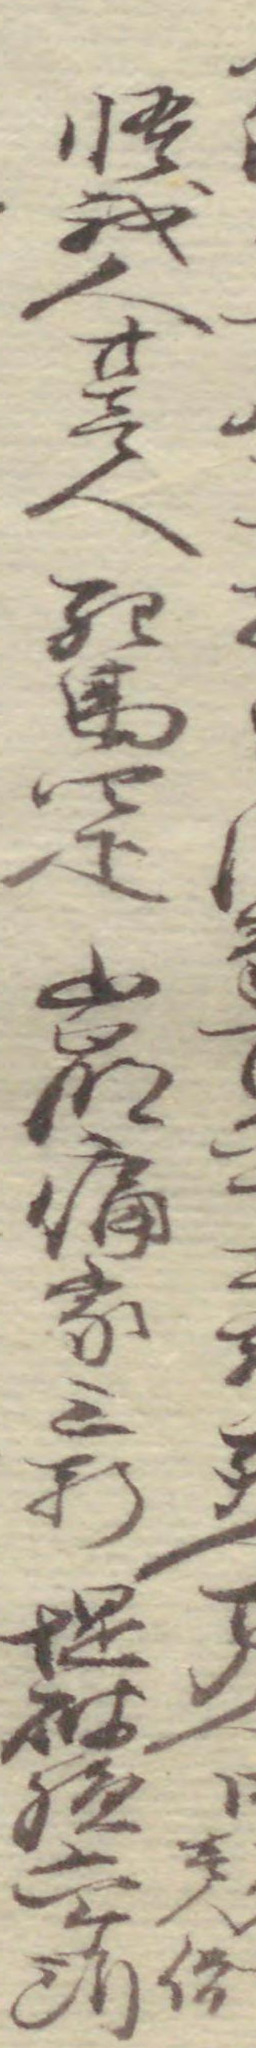怪我人廿壱人死馬四疋山崩潰家三軒堤破損六ケ所
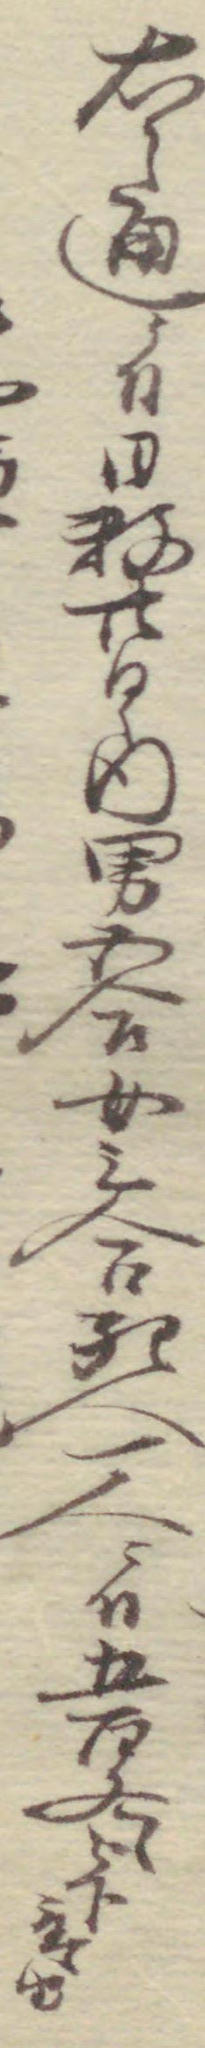右之通ニ付日数廿日之内男五合女三合死人一人ニ付五百文ツヽ被下置候由
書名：鶯宿雑記. 巻199-200
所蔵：国立国会図書館 National Diet Library, JAPAN
